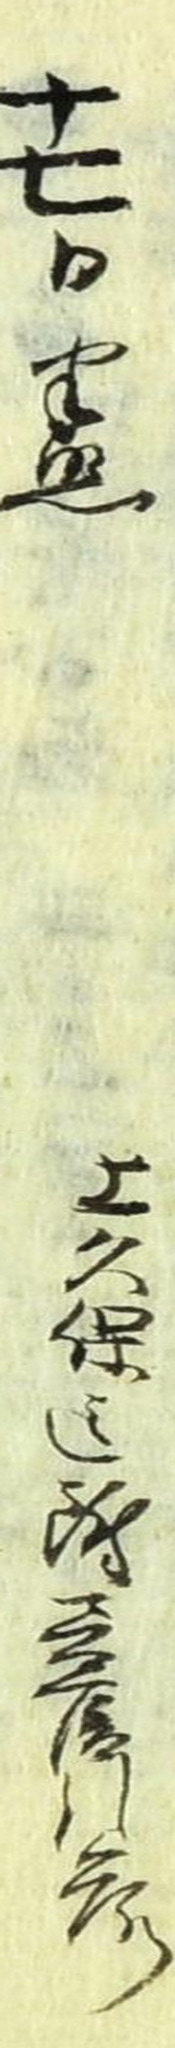十七日半照上久保迄附昼後引落
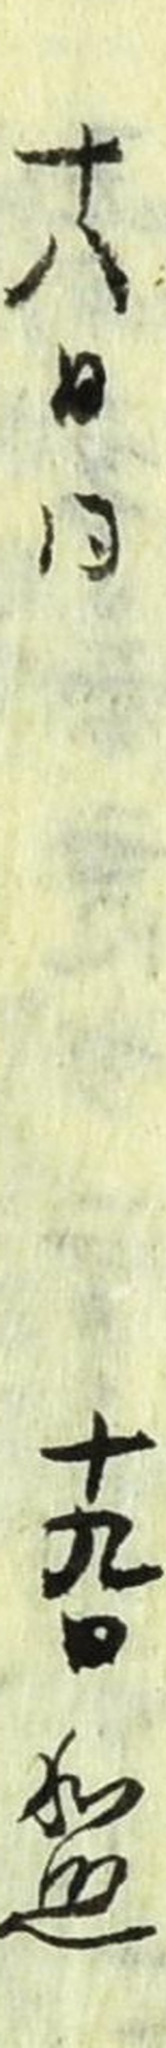十八日同十九日和照
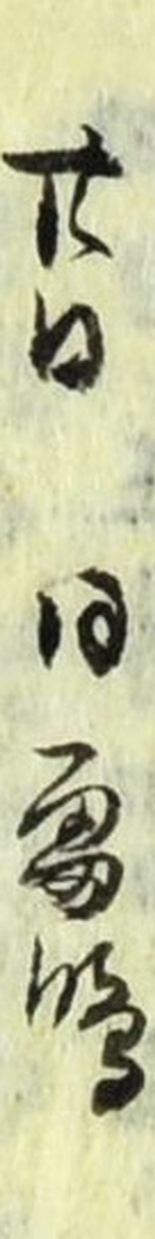廿日同雷鳴
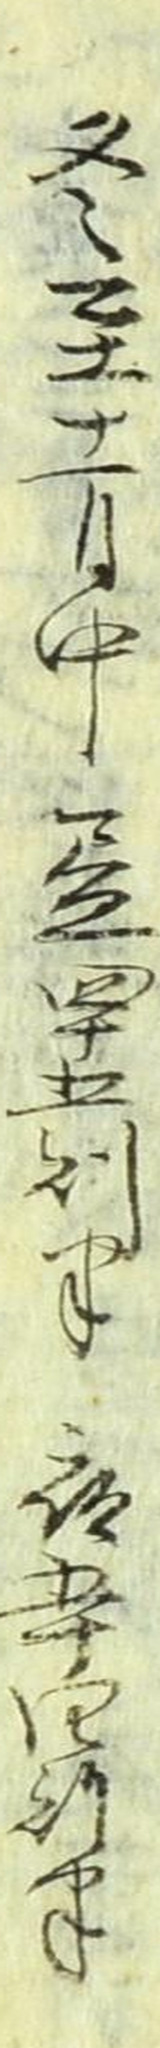冬至十一月中昼四十五刻半夜五十四刻半
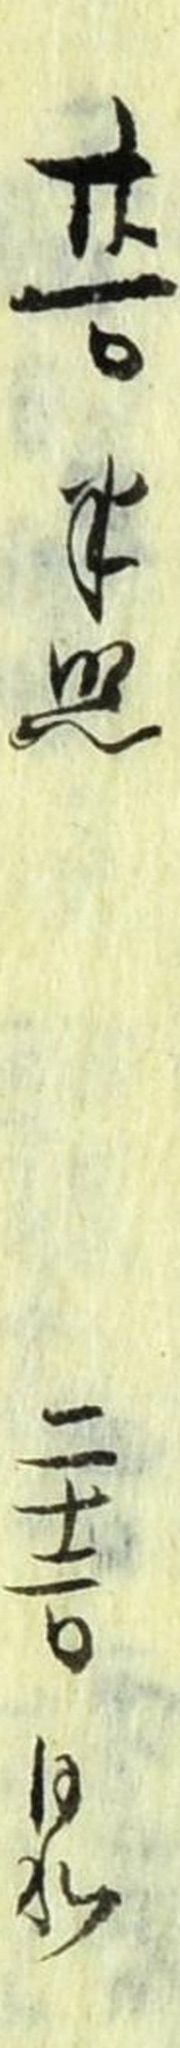廿一日半照二十二日日和
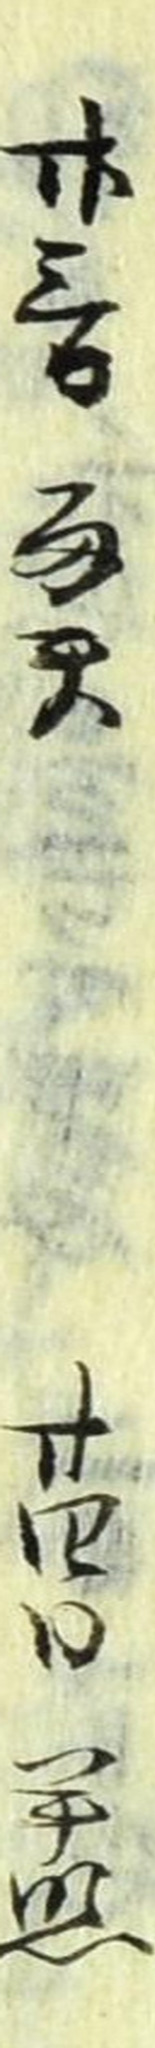廿三日雨天廿四日半照
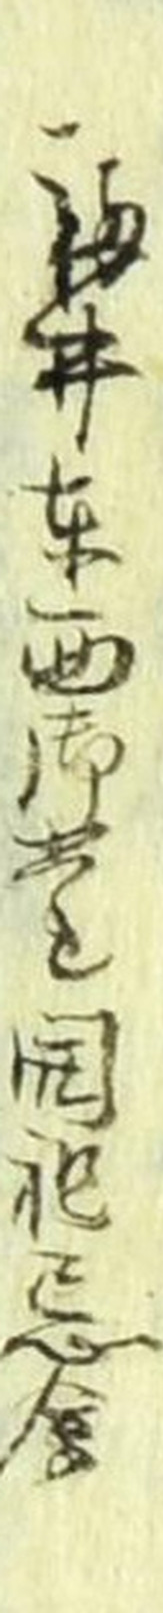福井東西御堂開祖忌会
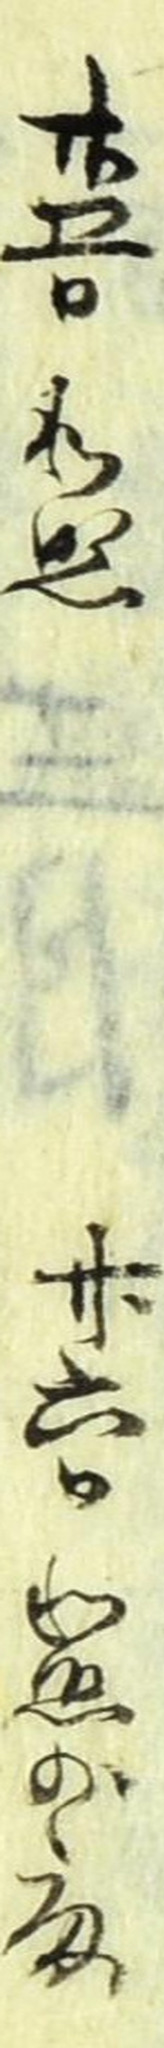廿五日和照廿六日和照少々雨
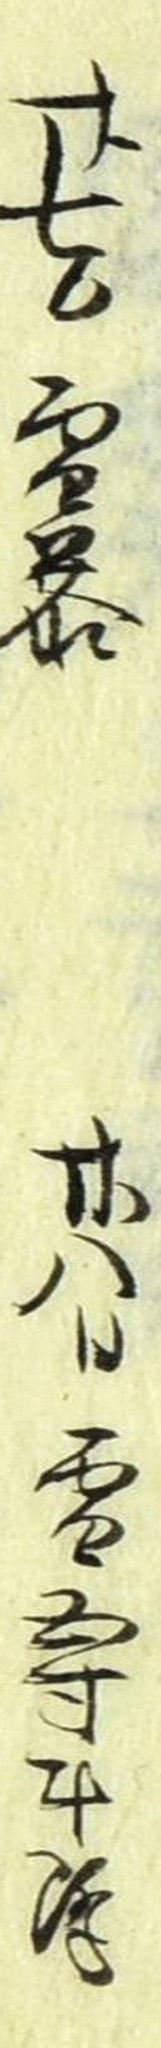廿七日雪暴廿八日雪五寸計降
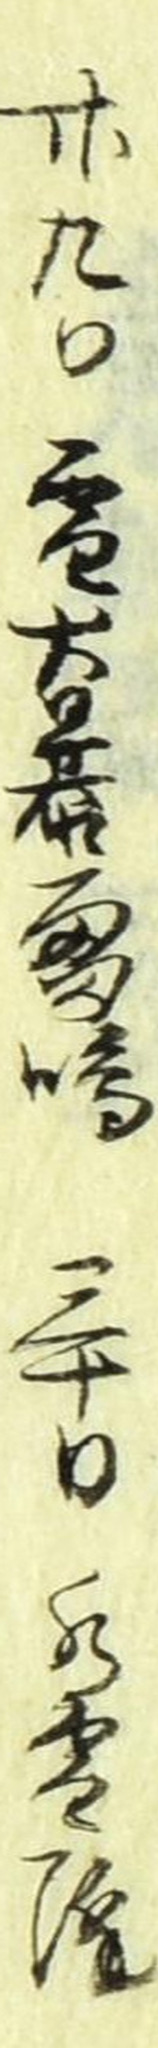廿九日雪大暴雷鳴三十日水雪降

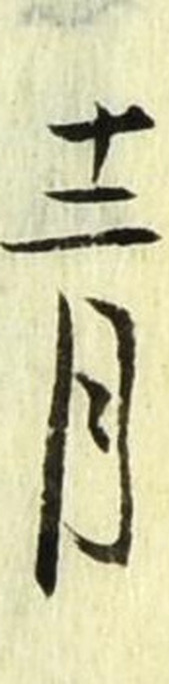十二月
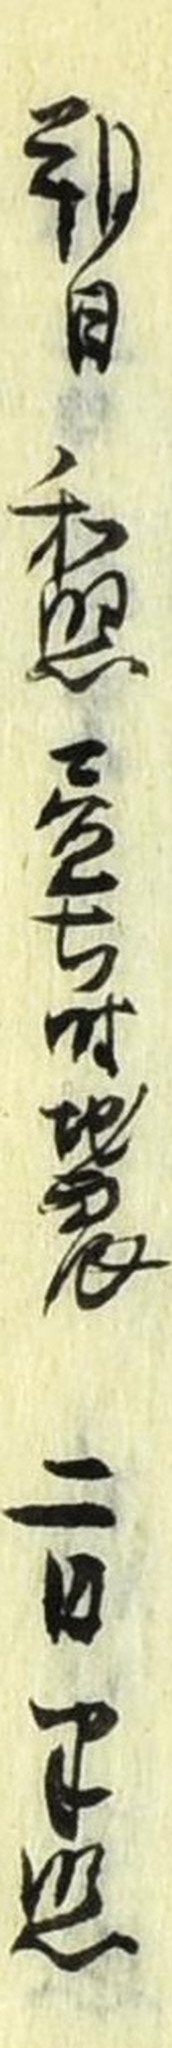朔日和照昼前時地震二日半照
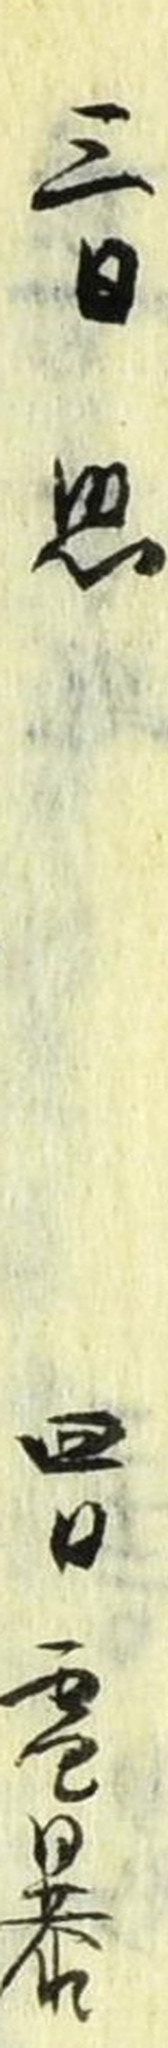三日照四日雪暴
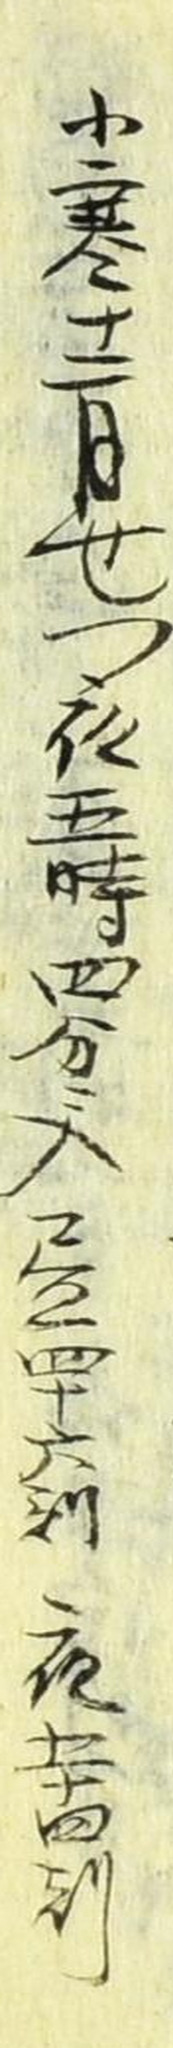小寒十二月せつ夜五時四分に入昼四十六刻夜五十四刻
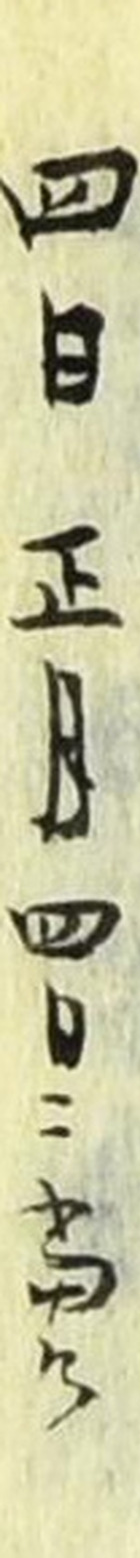四日正月四日に当る
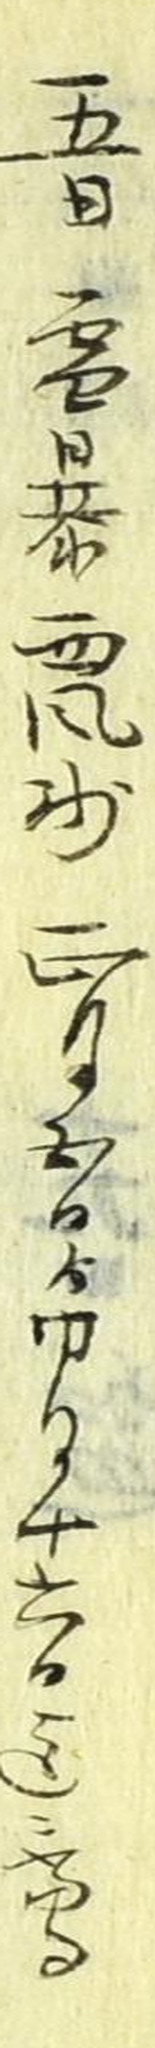五日雪暴西風氷正月五日ゟ同月十六日迄に当る
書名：（日記）
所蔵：福井県文書館 Fukui Prefectural Archives
